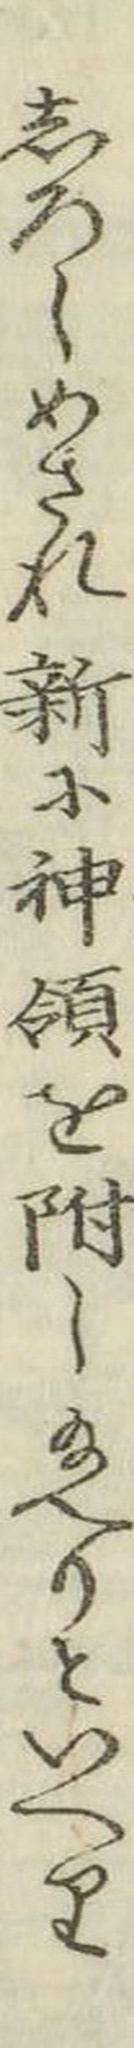しろしめされ新に神領を附し給へりといへり
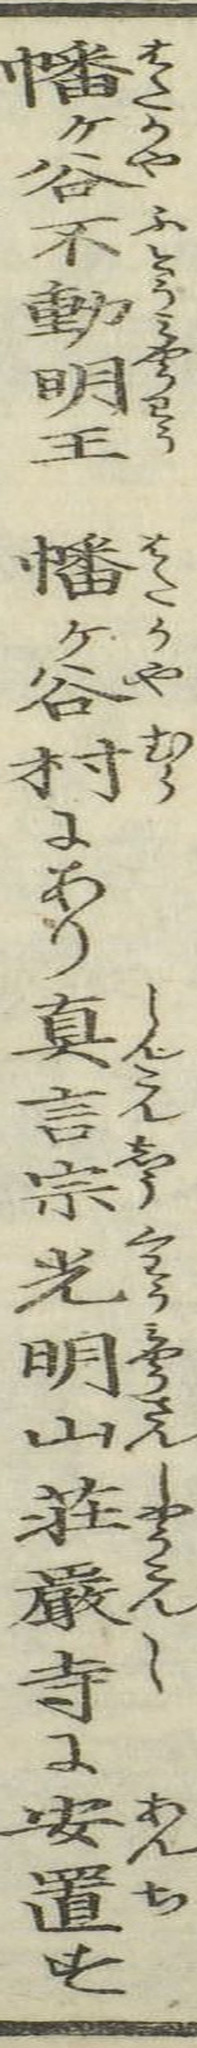幡ヶ谷不動明王幡ヶ谷村にあり真言宗光明山荘厳寺に安置す
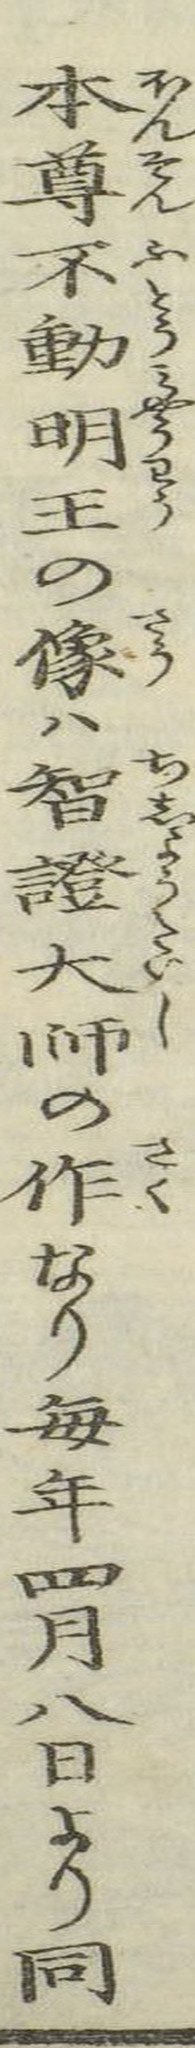本尊不動明王の像は智証大師の作なり毎年四月八日より同
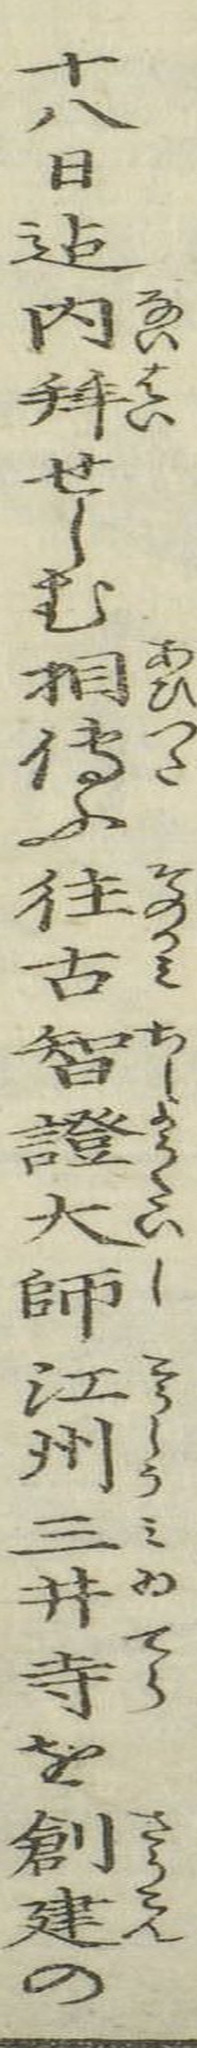十八日迄内拝せしむ相伝ふ往古智証大師江州三井寺を創建の
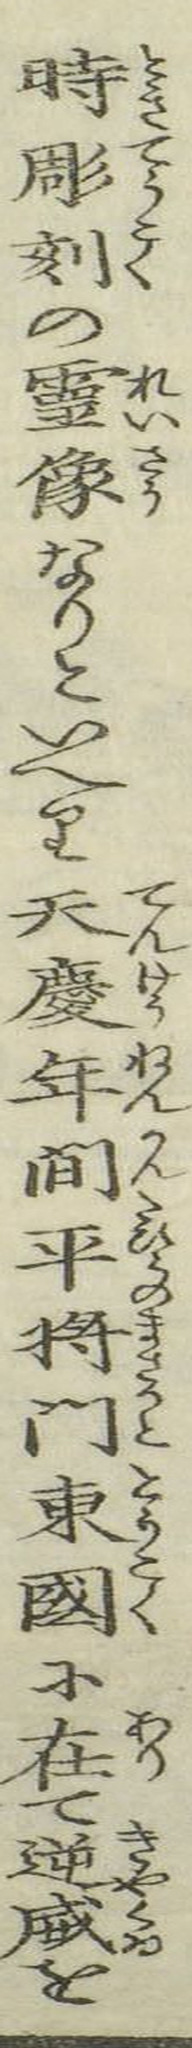時彫刻の霊像なりといへり天慶年間平将門東国に在て逆威を
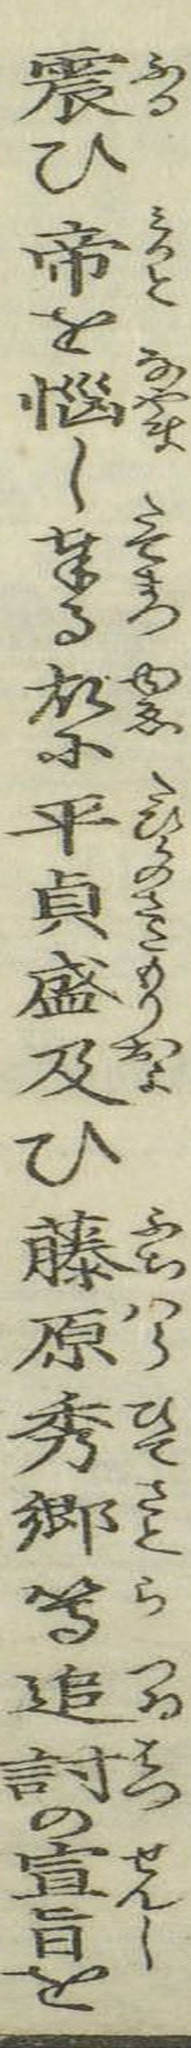震ひ帝を悩し奉る故に平貞盛及ひ藤原秀郷等追討の宣旨を
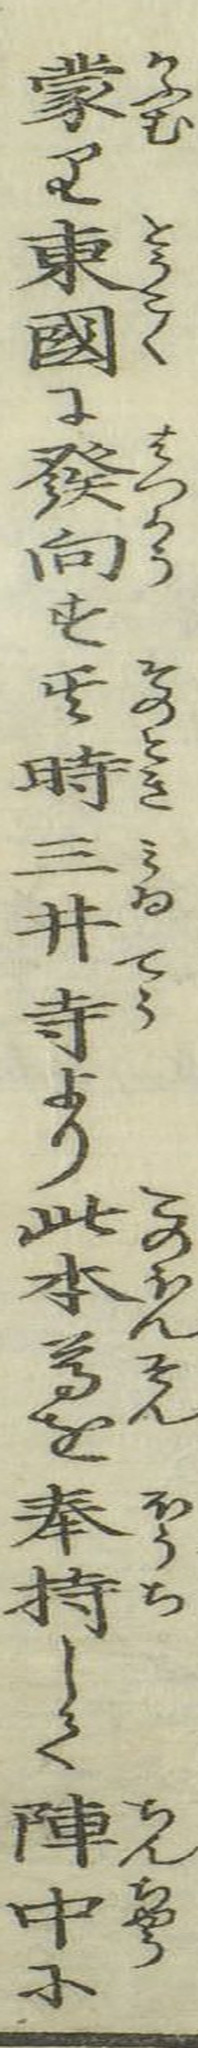蒙り東国に発向す其時三井寺より此本尊を奉持して陣中に

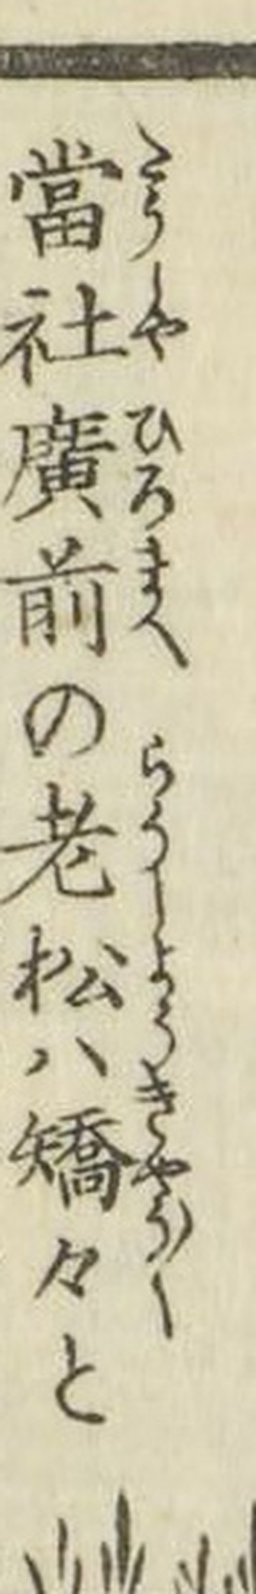当社広前の老松は矯々と
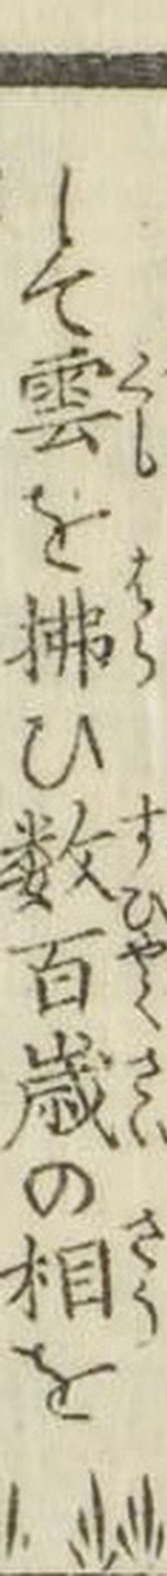して雲を払ひ数百歳の相を
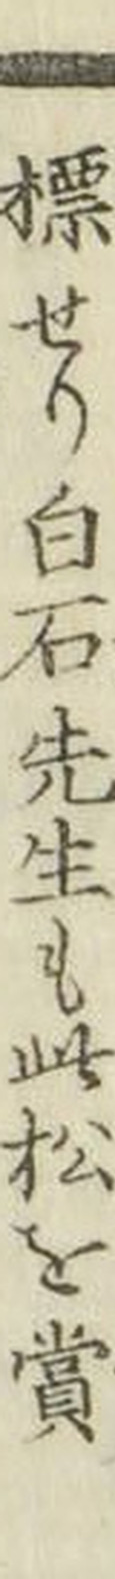標せり白石先生も此松を賞
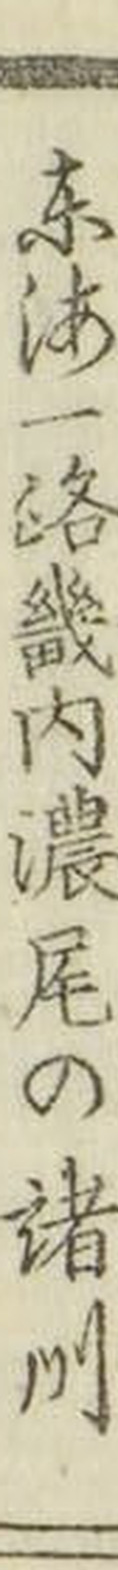東海一路畿内濃尾の諸州
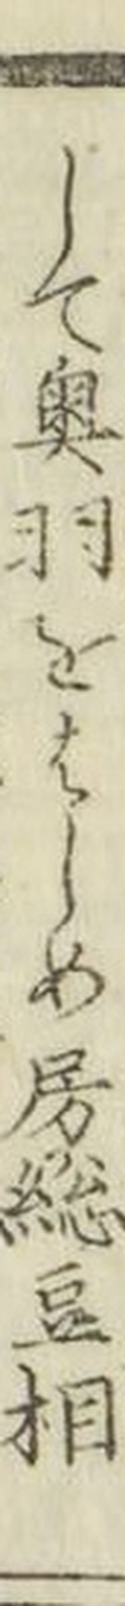して奥羽をはしめ房総豆相
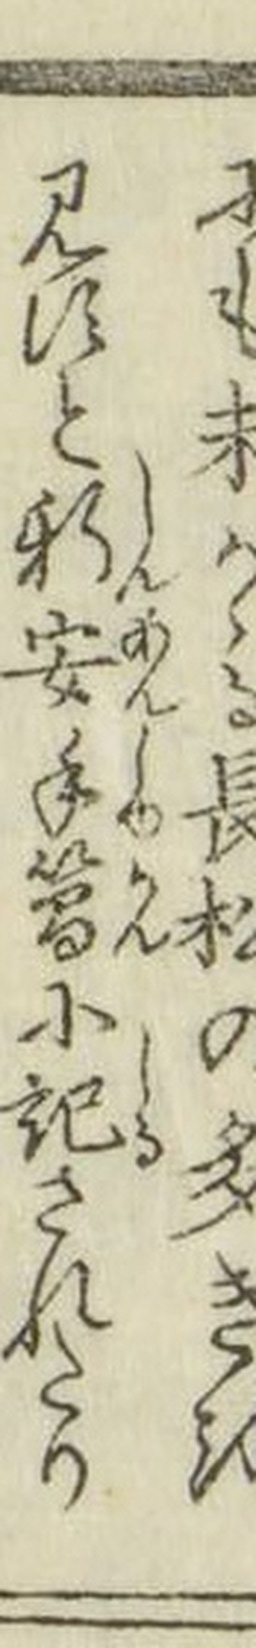見すと新安手簡に記されたり
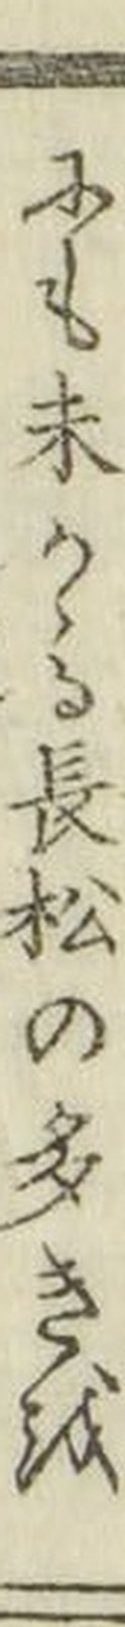にも未かゝる長松の多きを
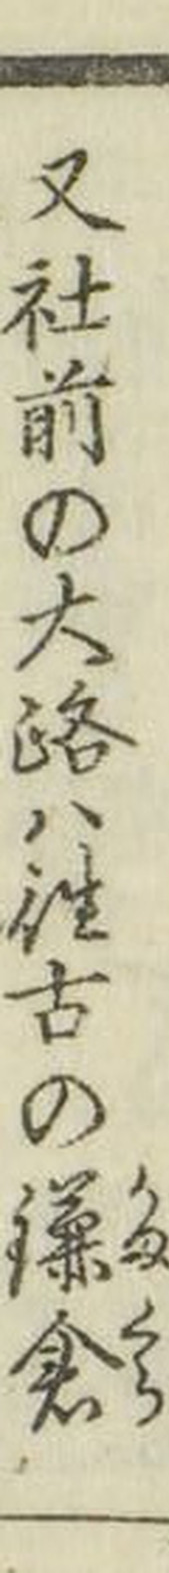又社前の大路は往古の鎌倉
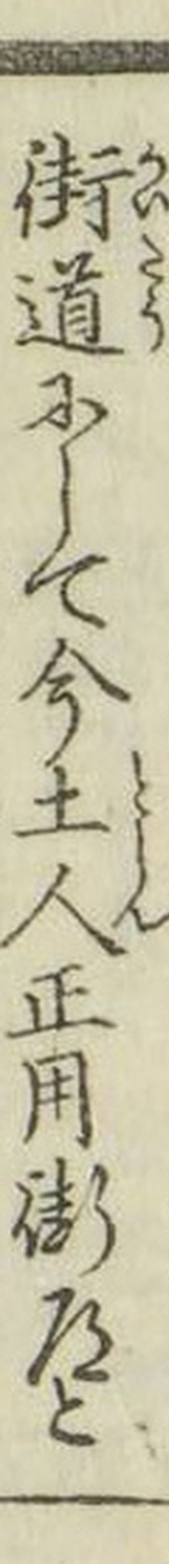街道にして今土人正用街道と
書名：江戸名所図会 20巻 巻之11
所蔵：東京学芸大学教育コンテンツアーカイブ
